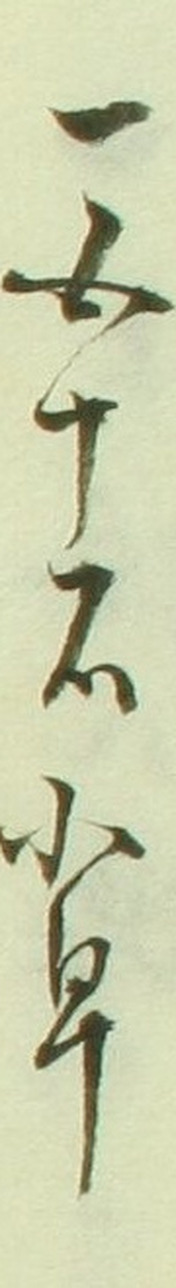一五十石小早
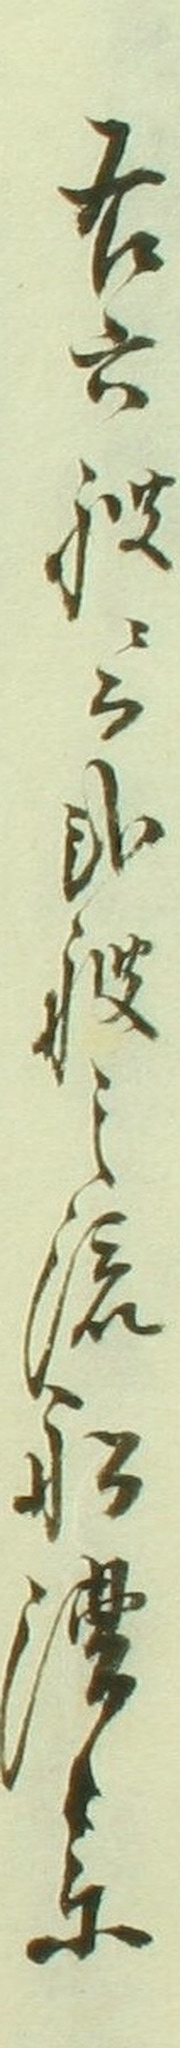右六艘ニ而弐艘之流船漕参
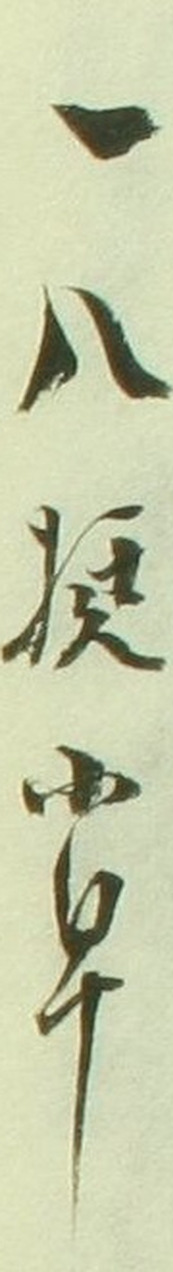一八挺小早
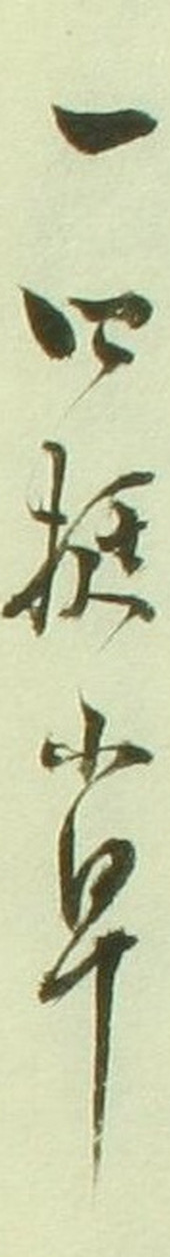一四挺小早
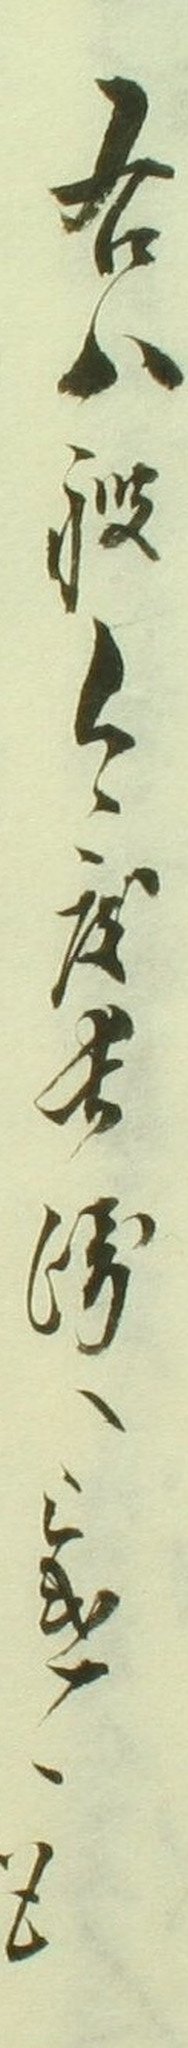右八艘今度長崎へ被遣候以上
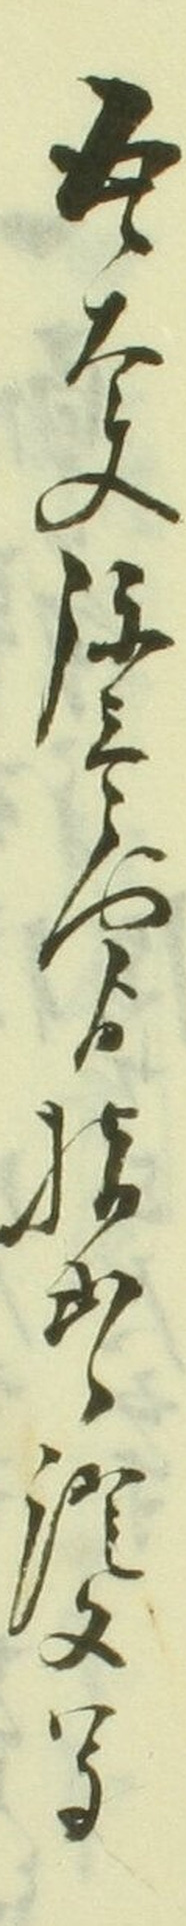五郎太夫弥三右衛門ゟ指出候証文等
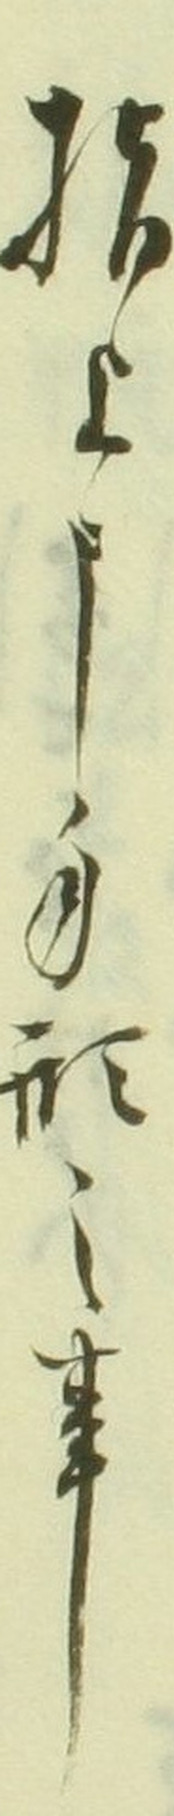指上申手形之事
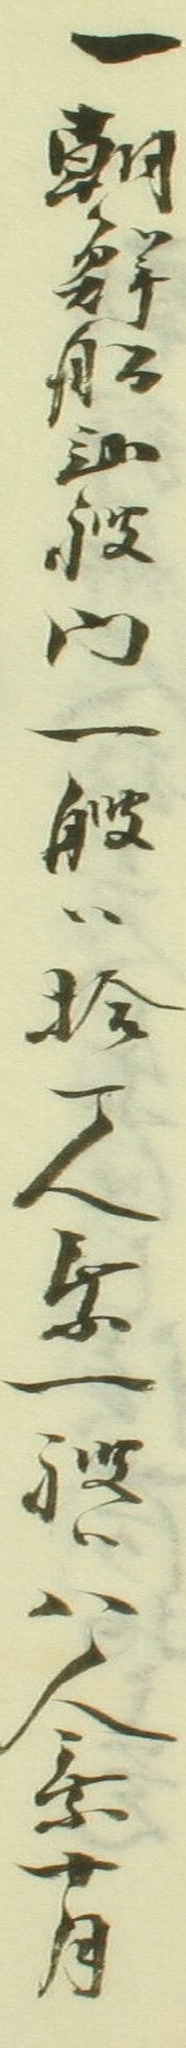一朝鮮船弐艘内一艘ハ拾一人乗一艘ハ八人乗十月
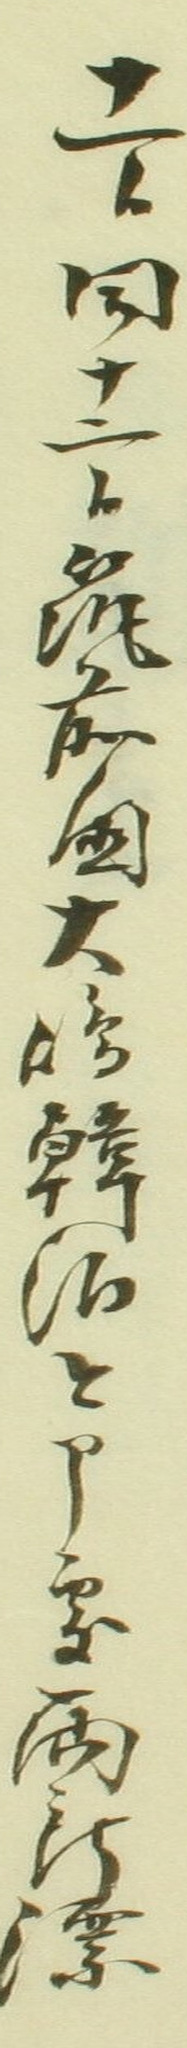十一日同十二日筑前国大嶋韓泊と申処商所漂
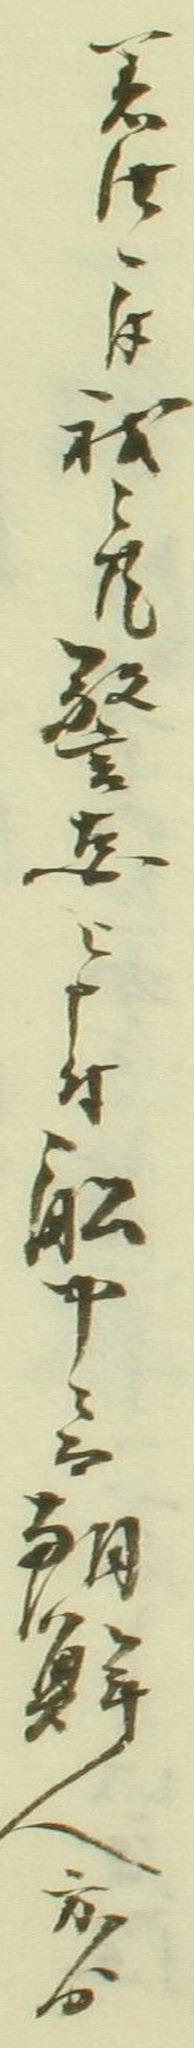着仕候付我々共警固被申付船中ニ而朝鮮人方ゟ
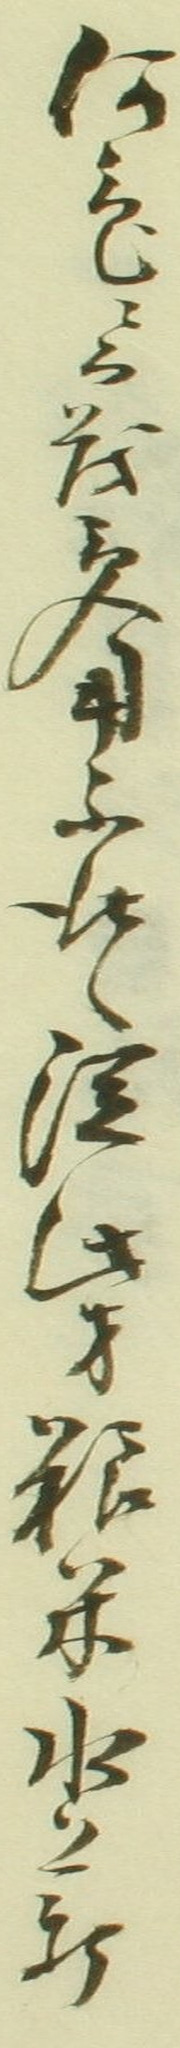何色ニ而も受用不仕候従此方糧米水薪
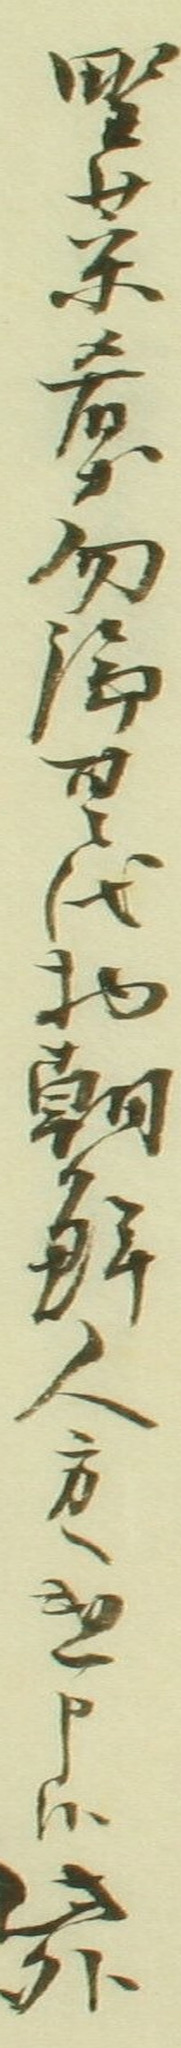野菜肴等勿論其代物朝鮮人方へ遣申候此外
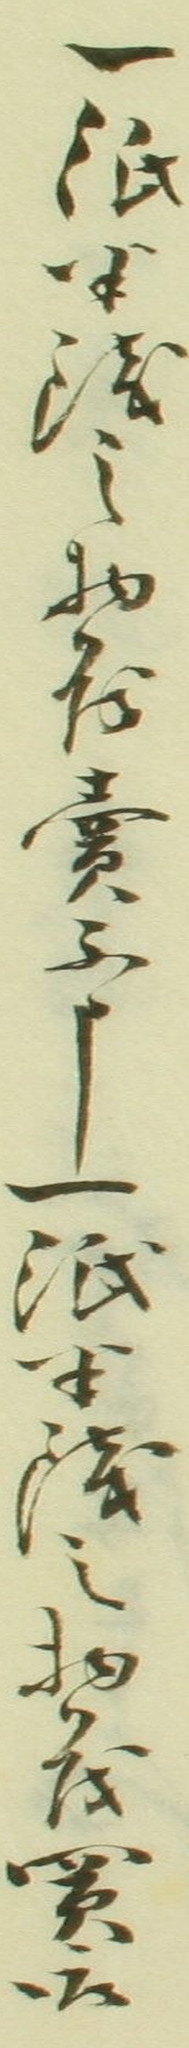一紙半銭之物も売不申一紙半銭之物も買取
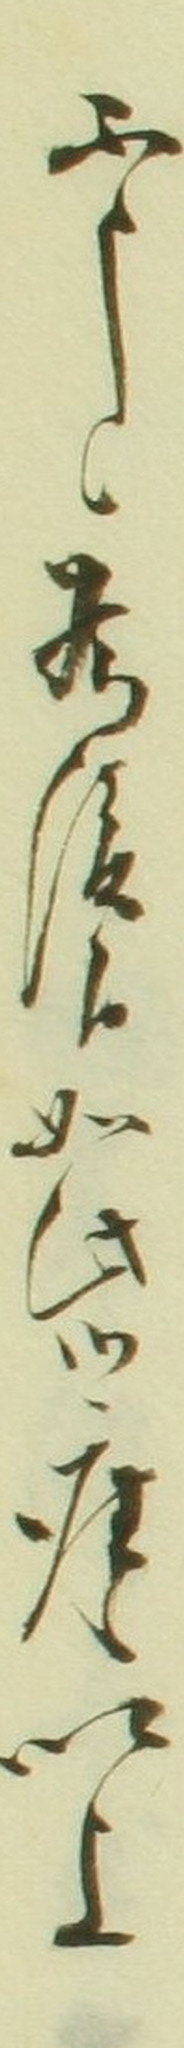不申候為後日如此御座候以上
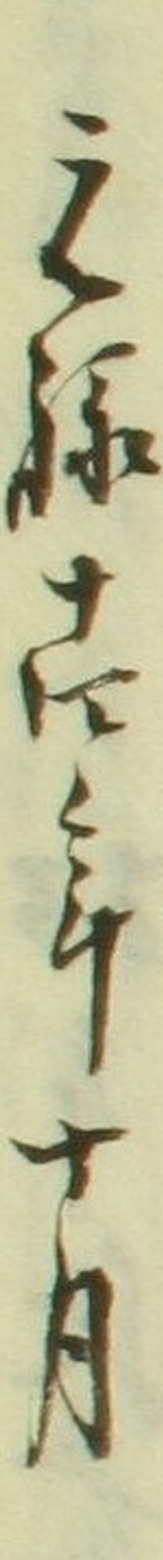元禄十四年十月

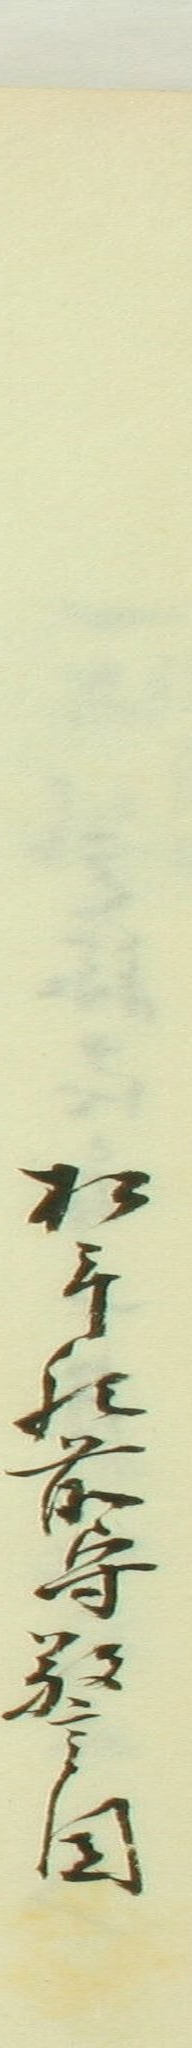松平肥前守警固
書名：異国船漂着記
